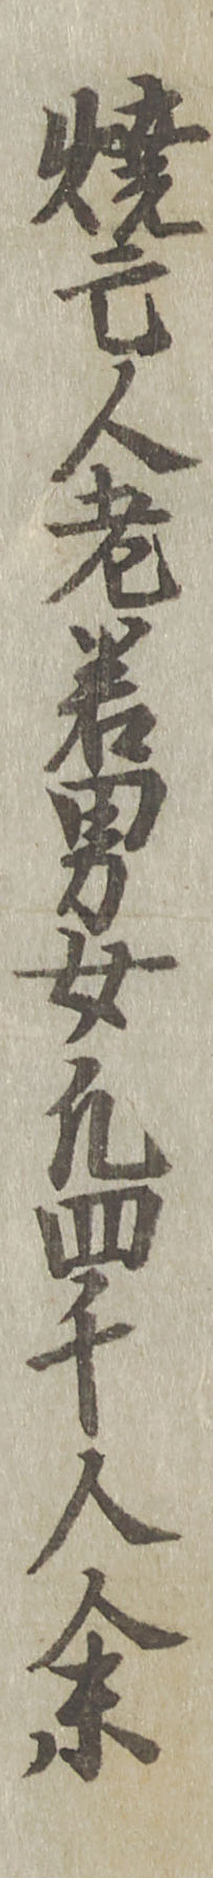焼亡人老若男女凢四千人余
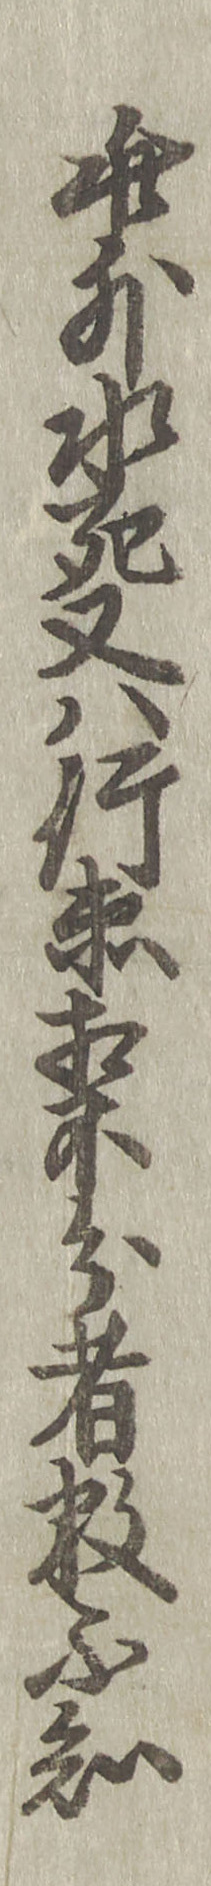此外水死又ハ行衛相不分者数不知
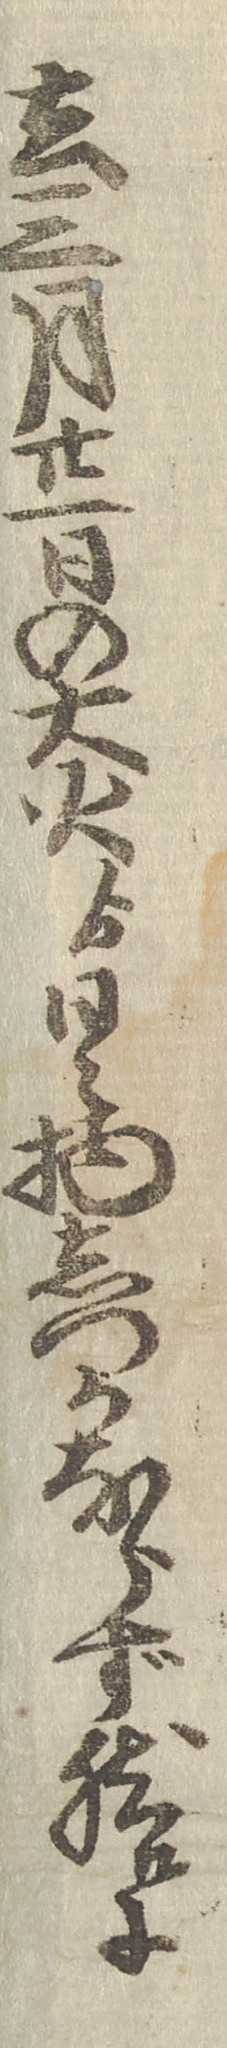去三月廿一日の大火ゟ日々物しつかならず然ルに
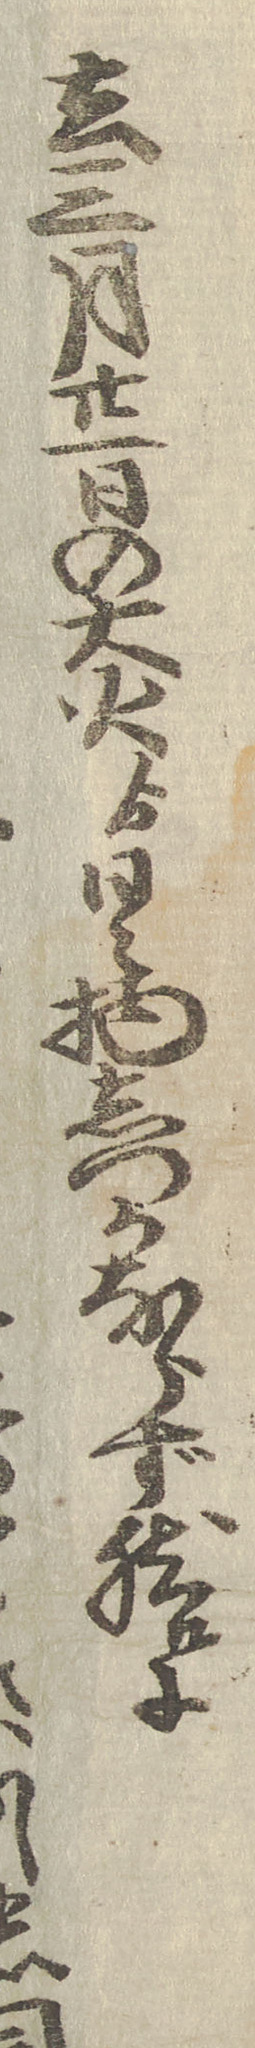去三月廿一日の大火ゟ日々物しつかならず然ルに
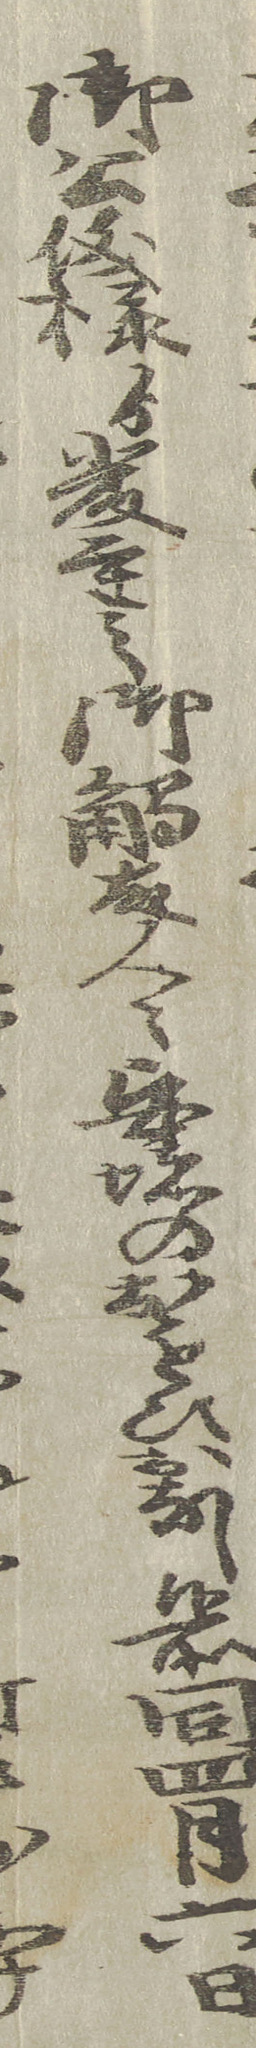御公儀様ゟ厳重之御觸故人々安堵のおもひおなし候所同四月六日
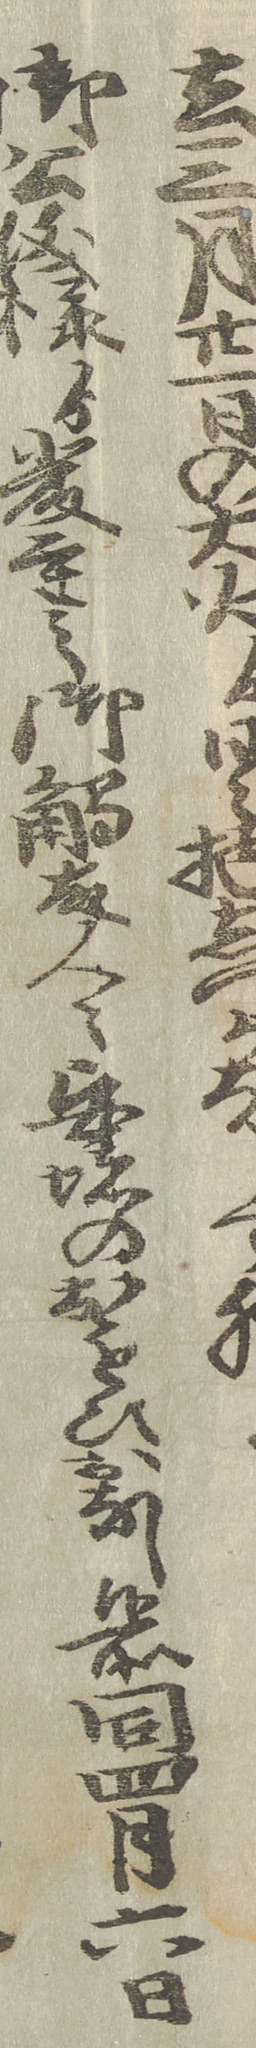御公儀様ゟ厳重之御觸故人々安堵のおもひおなし候所同四月六日
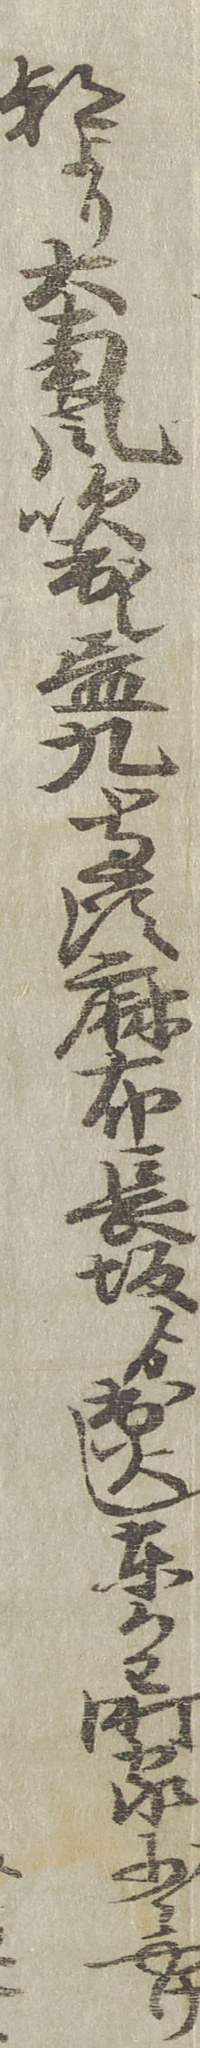朝より大南風吹出し昼九ツ過頃麻布長坂ゟ出火し東かわ町家少々やけ
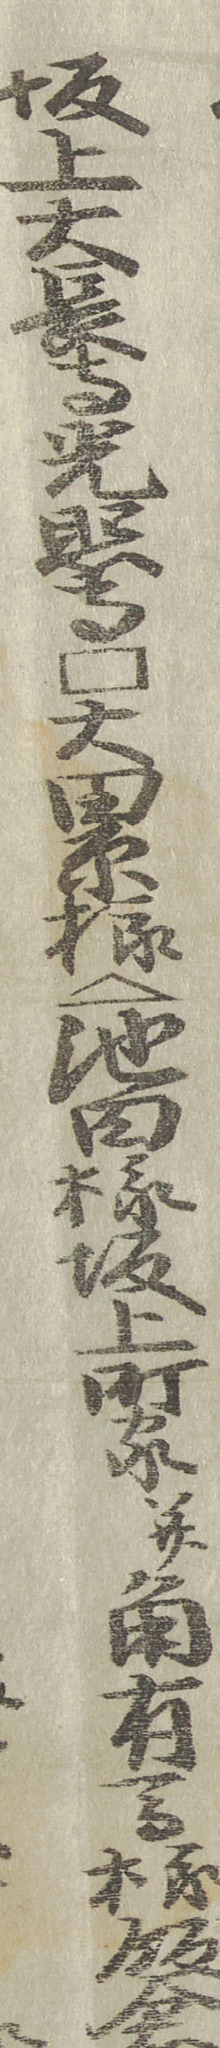坂上大長寺光照寺大田原様△池田様坂上町家并角有馬様飯倉
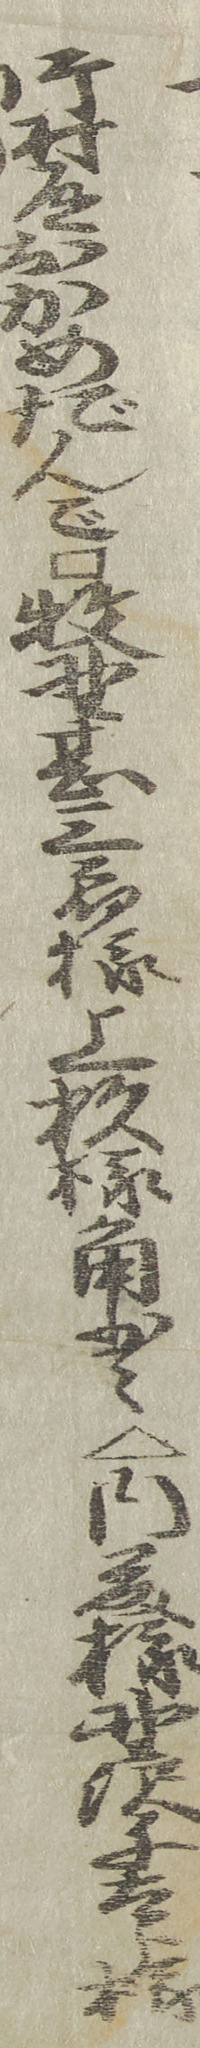片町通おかめだんご牧野甚三郎様上杉様角少々△内藤様野沢千太郎様
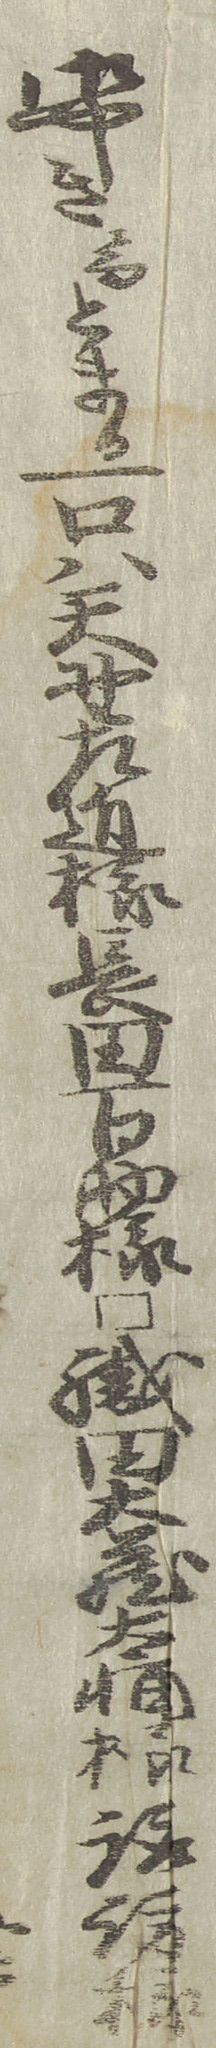御やきニ而とまる一口ハ天野左近様長田百助様織田大蔵太輔様諏訪様
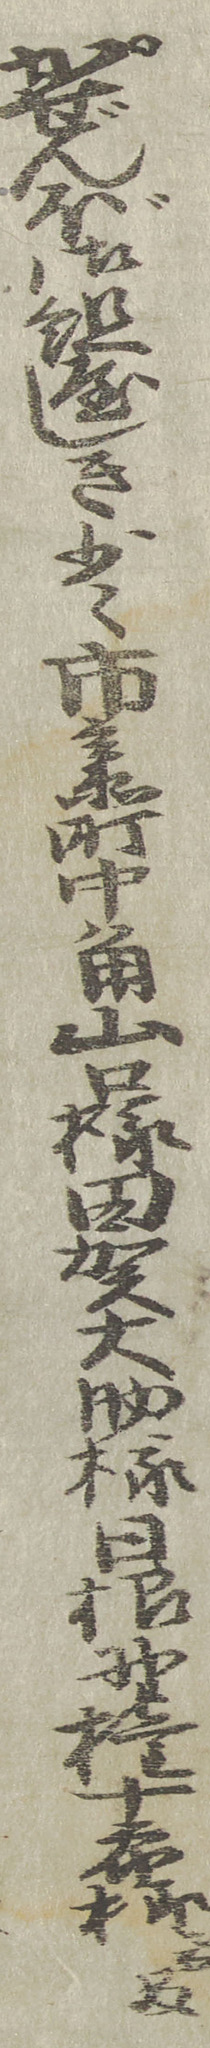かぜんぼ御組屋しき少々市兵衛町中角山口様田賀大助様日根野権十郎様ニ而留
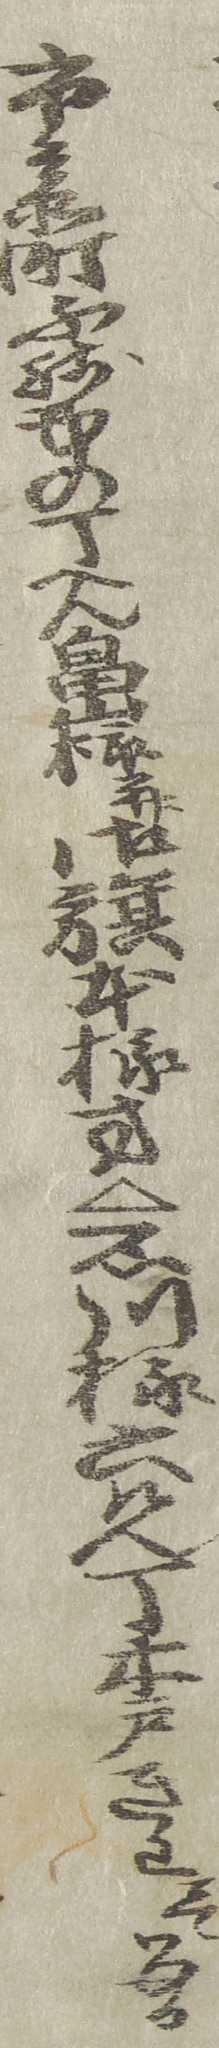市兵衛町不やの丁へん畠山様并御旗本様方△石川様六けん丁木戸さわニて留る
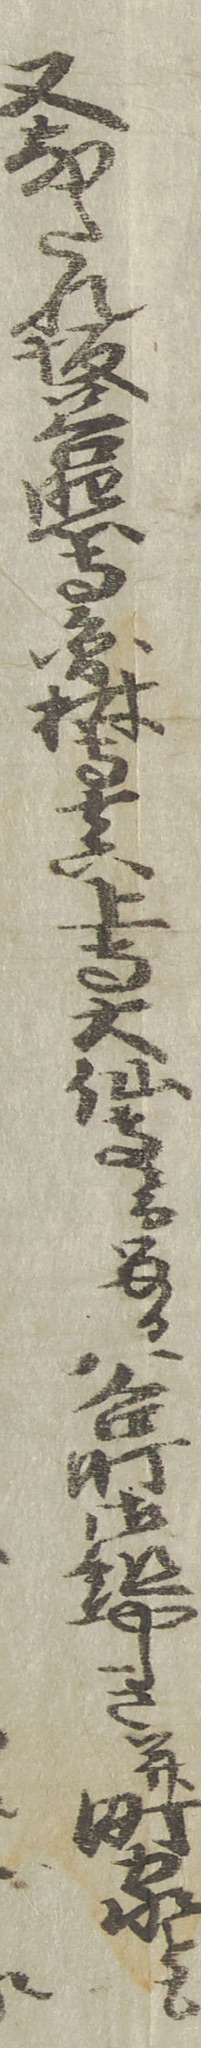又なたれ坂善照寺圓林寺真上寺大仙寺ニ而留る谷町御組やしき并町家とも
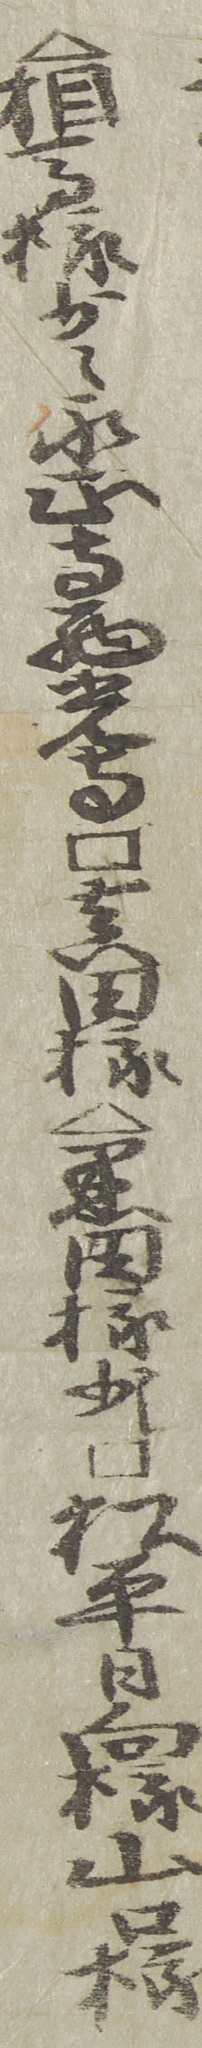△相馬様少々永正寺西光寺真田様△黒田様少し松平日向様山口様
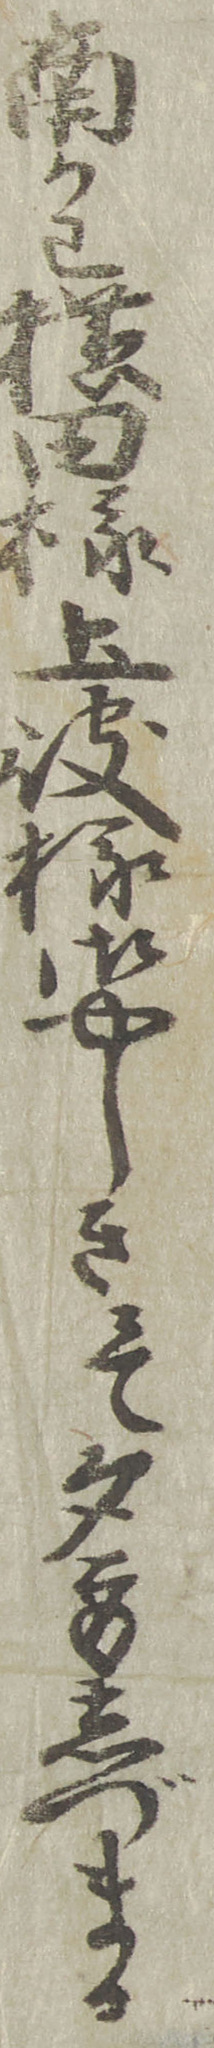南かわ横田様土岐様御やしきニて夕方しづまる
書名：方角場所附 [江戸大火]
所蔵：東京大学総合図書館 General Library in the University of Tokyo, JAPAN
